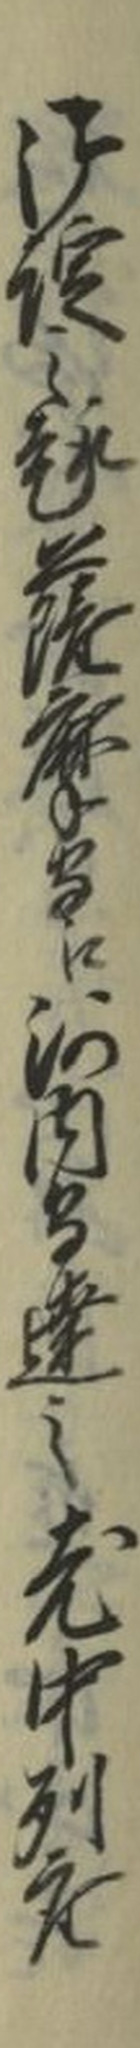御諚之趣薩摩守え河内守達之老中列座
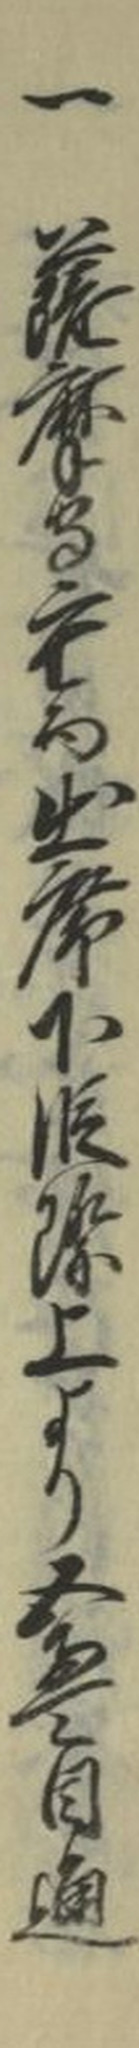一薩摩守重而出席下段際上より五畳目通
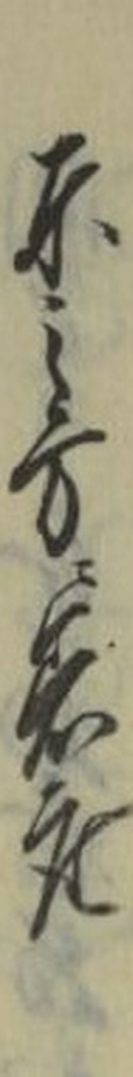東之方に着座
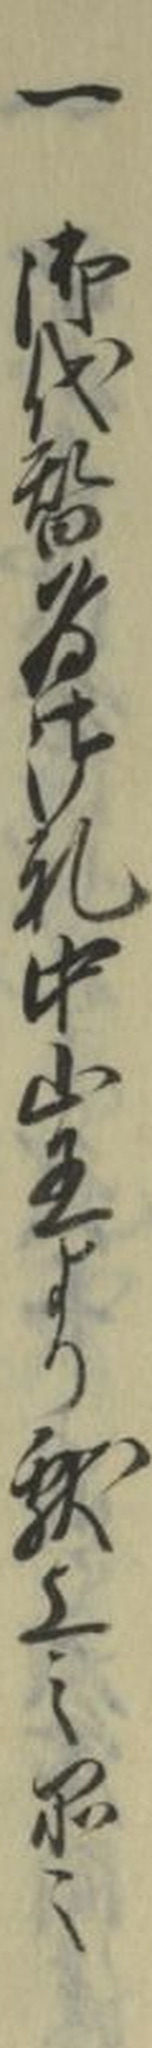一御代替為御礼中山王より献上之品々
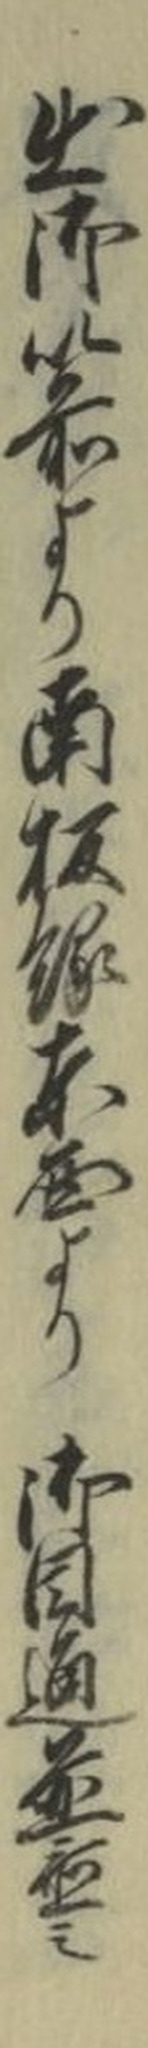出御以前より南板縁東西より御目通並置之
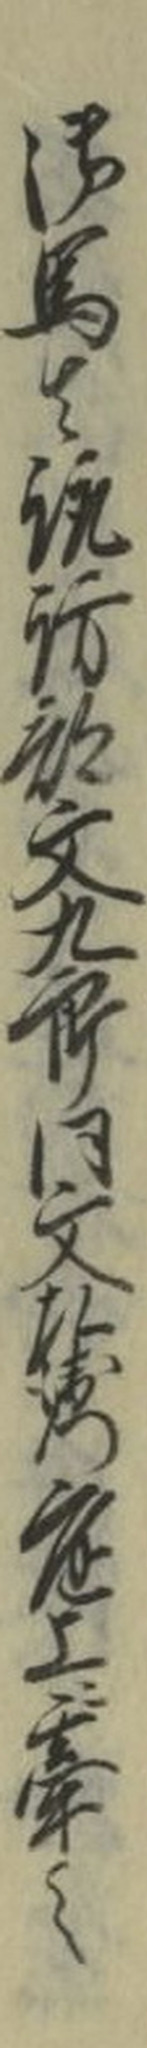御馬は諏訪部文九郎同文左衛門庭上に牽之
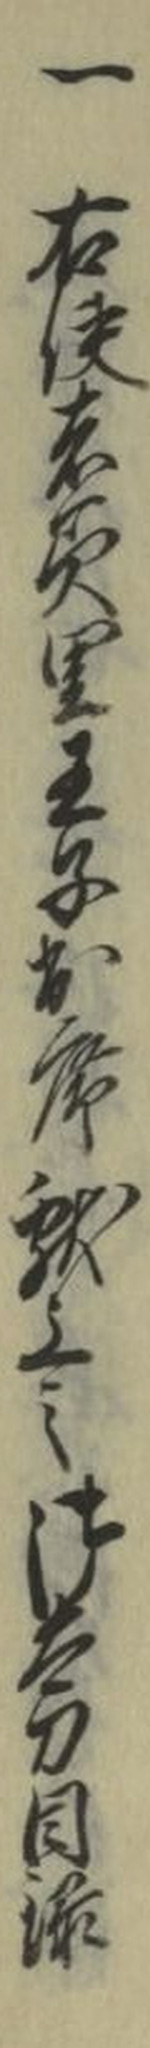一右使者美里王子出席献上之御太刀目録
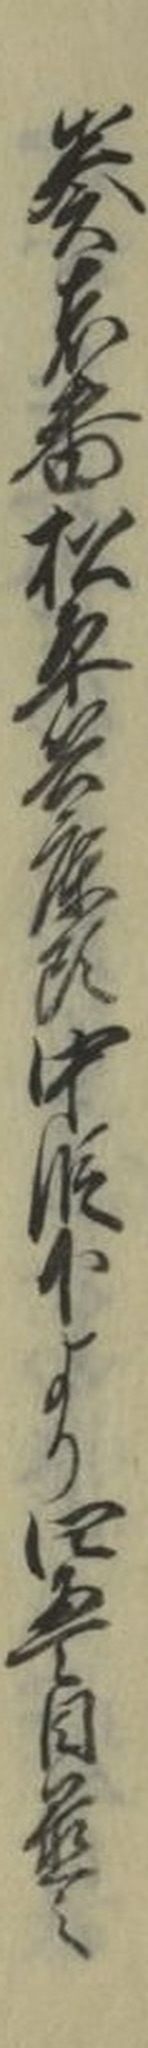奏者番松平兵庫頭中段下より四畳目置之

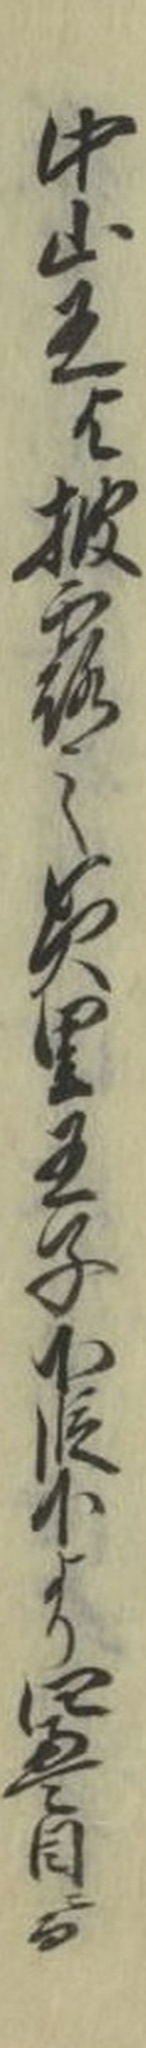中山王と披露之美里王子下段下より四畳目に而
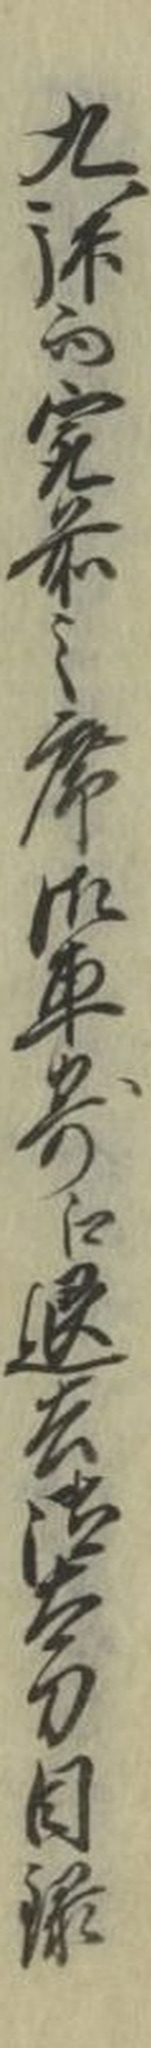九拝而最前之席御車寄え退去御太刀目録
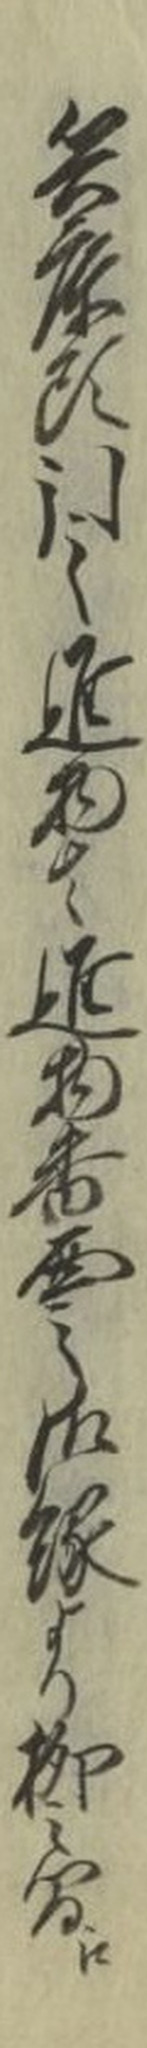兵庫頭引之進物は進物番西之御縁より柳之間え
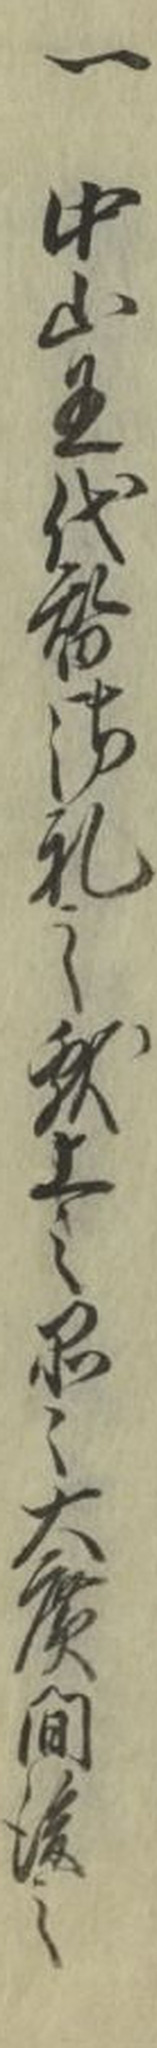一中山王代替御礼之献上之品々大広間後之
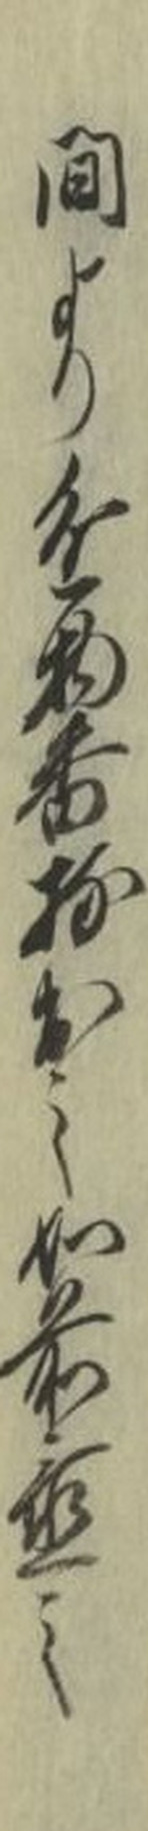間より進物番持出之如前置之
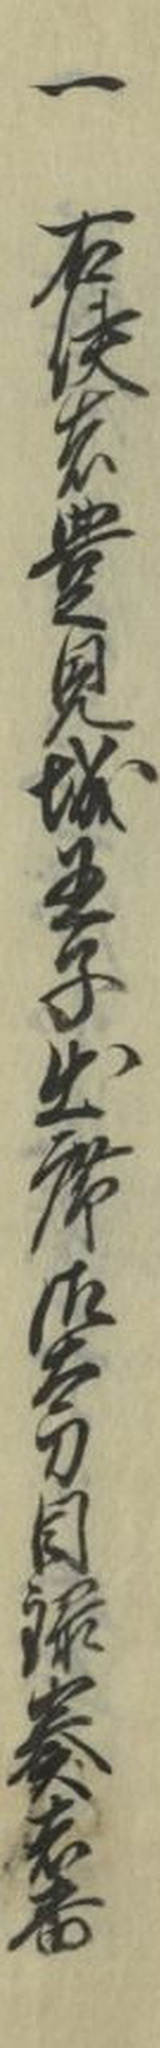一右使者豊見城王子出席御太刀目録奏者番
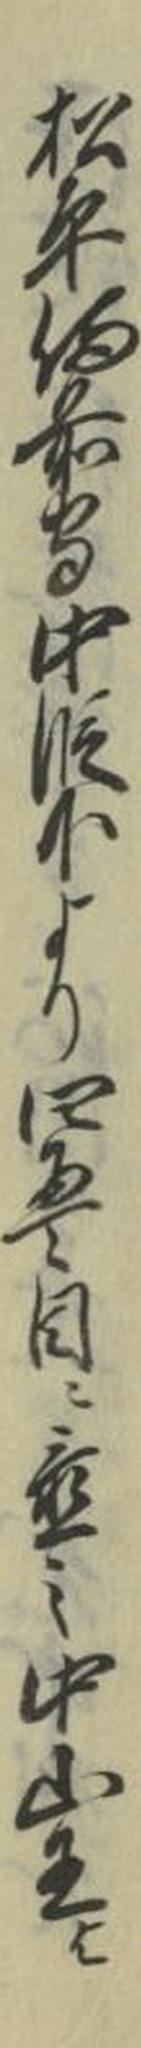松平備前守中段下より四畳目に置之中山王と
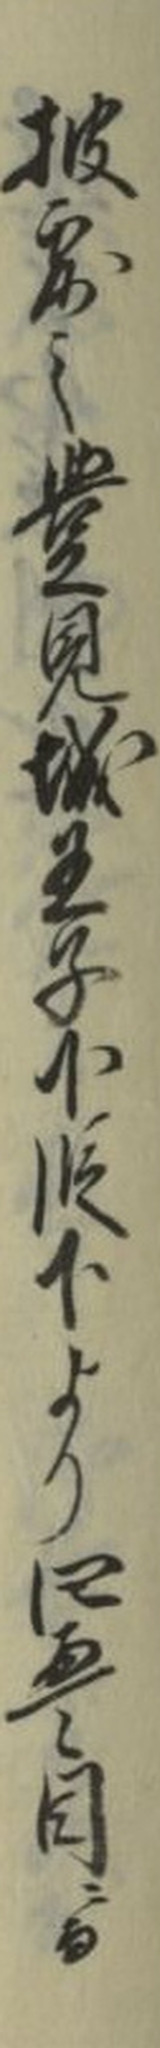披露之豊見城王子下段下より四畳目に而
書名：琉球人参府記
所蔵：University of the Ryukyus Library
